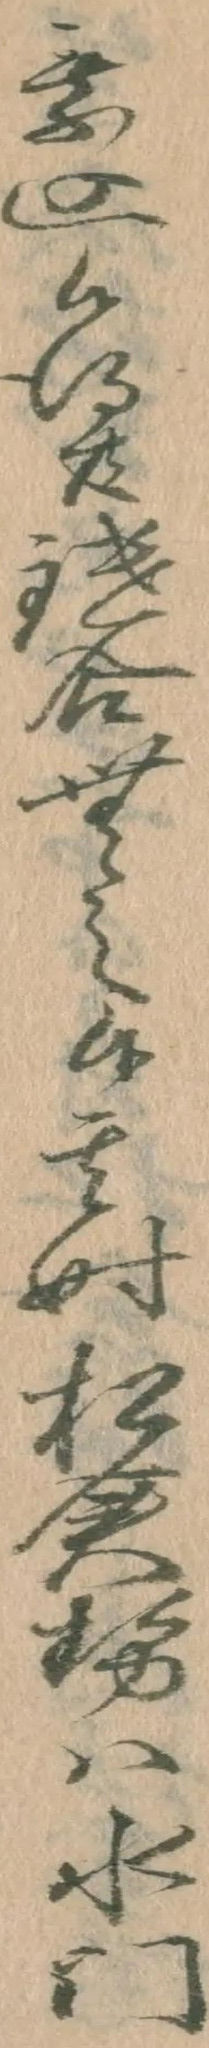乗込候得共鑓合無之候其時松倉勢は水門
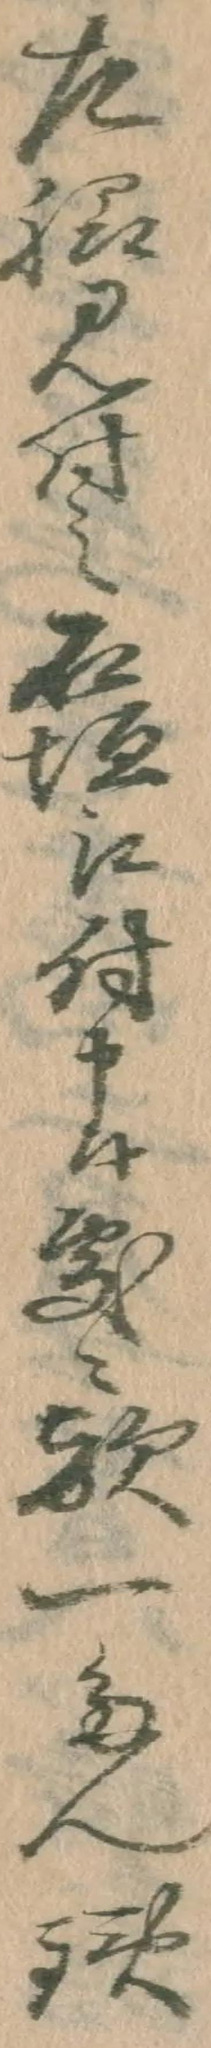左脇見付之石垣江付申候處に敵一多ん鉄
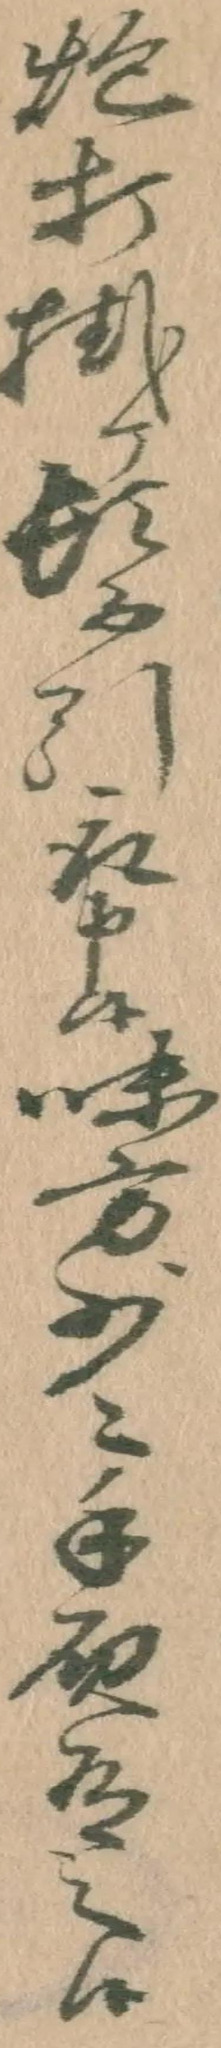砲打掛け頓而引取申候味方少々手負有之候
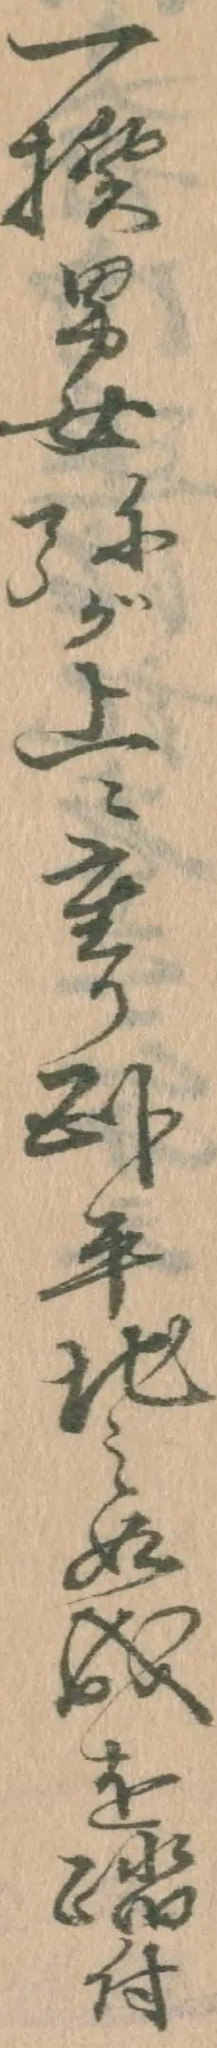一揆男女弥が上に重り臥平地之如成を踏付
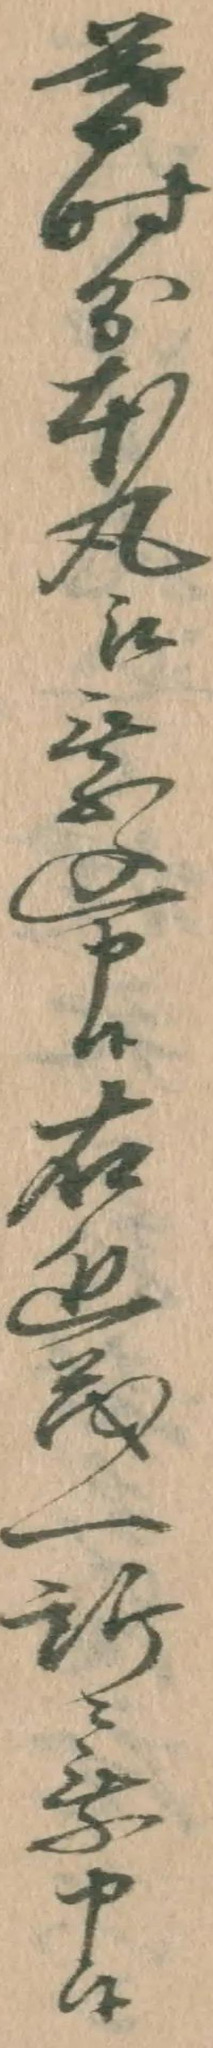暮時分本丸江乗込申候右近茂一所に乗申候
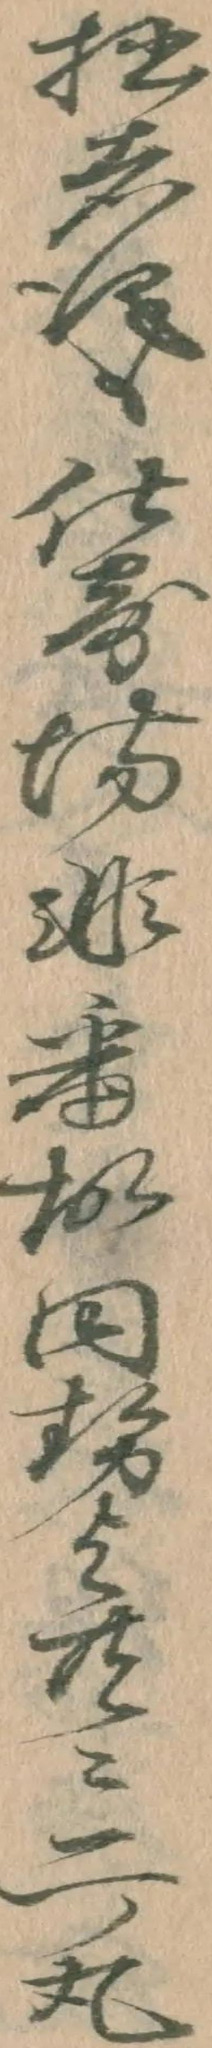拙者儀も仕寄場非番故同勢与共に二之丸
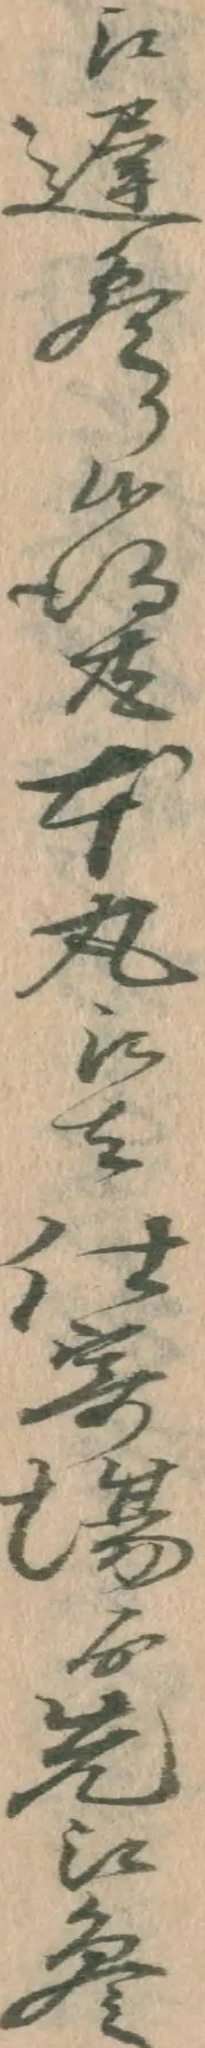江遅参り候得共本丸江者仕寄場ゟ先江参
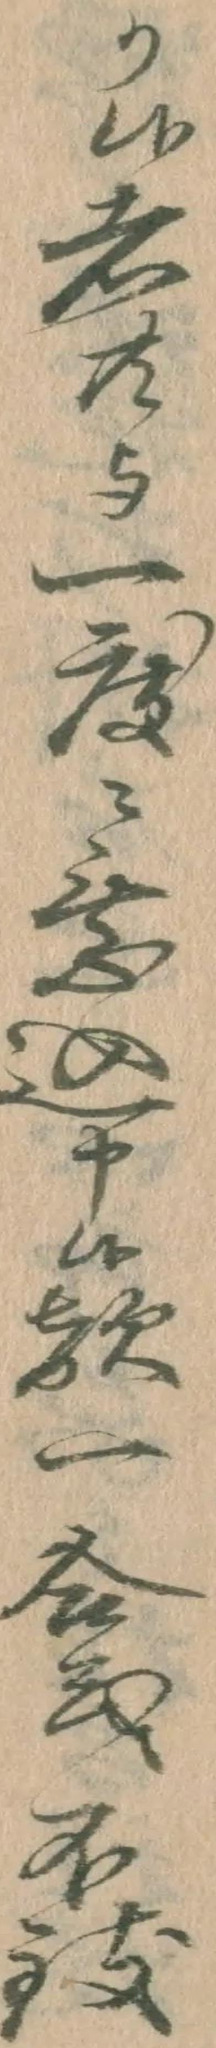り候者共与一度に乗込申候敵一合茂不致
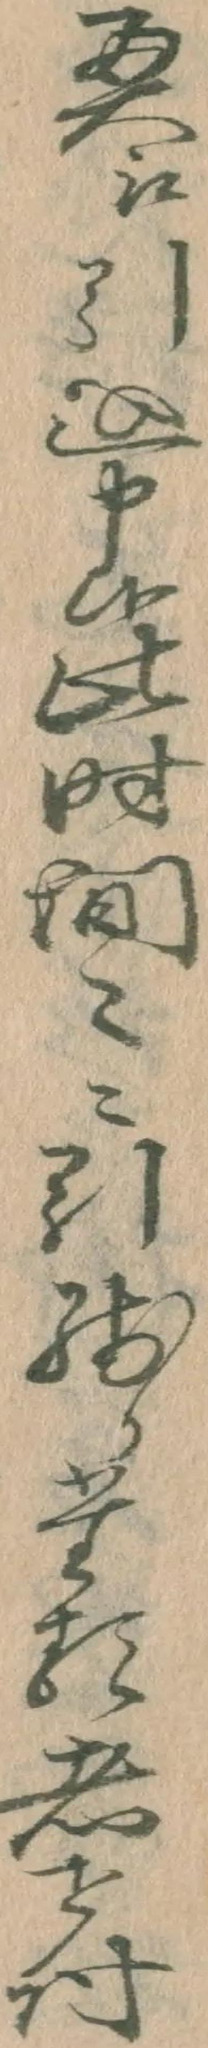奥江引込申候此時間々に引残り堂類者を付
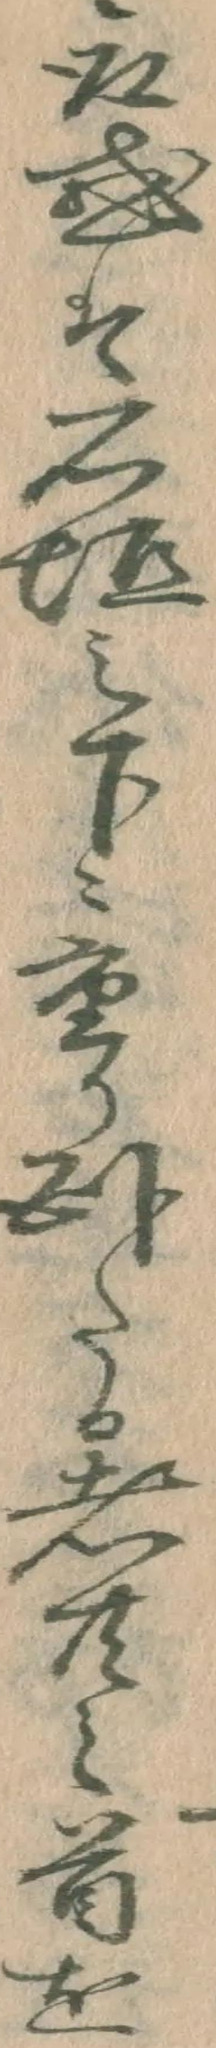取或盤石垣之下に重り臥たる者共之首を
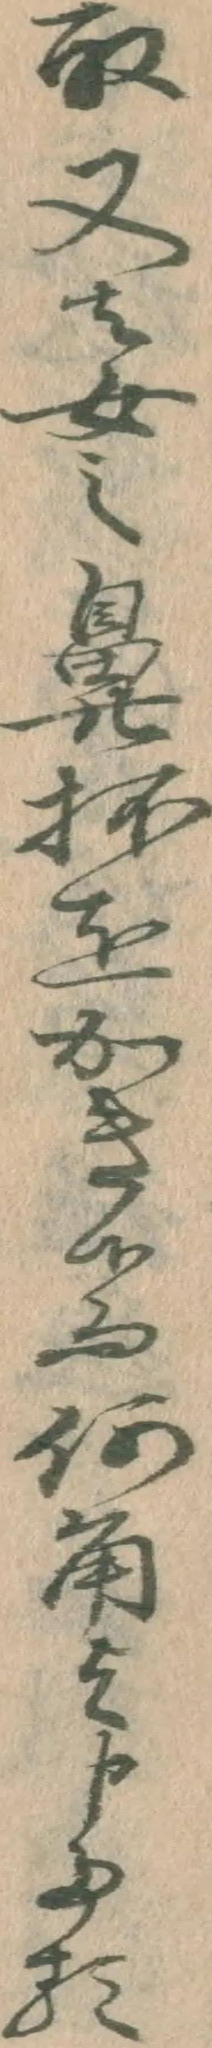取又者女之鼻抔をかき候而何角与申多類
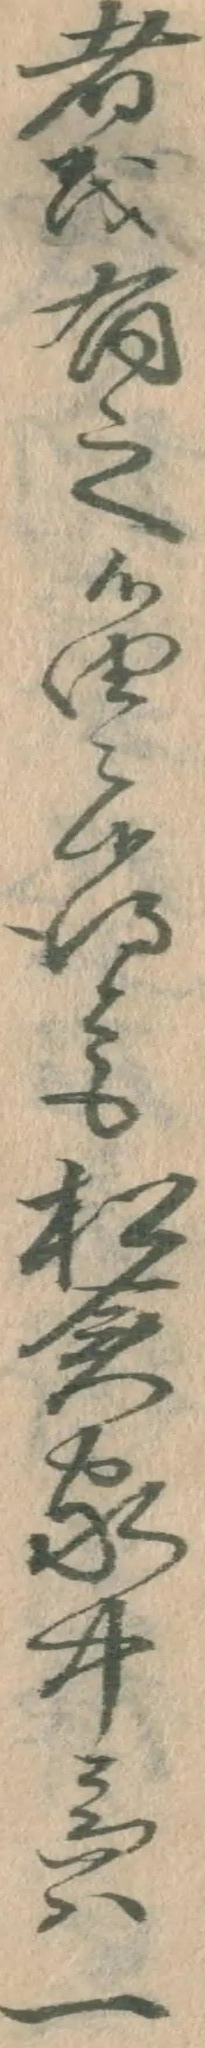者茂有之候由に候得とも松倉家中に而は一
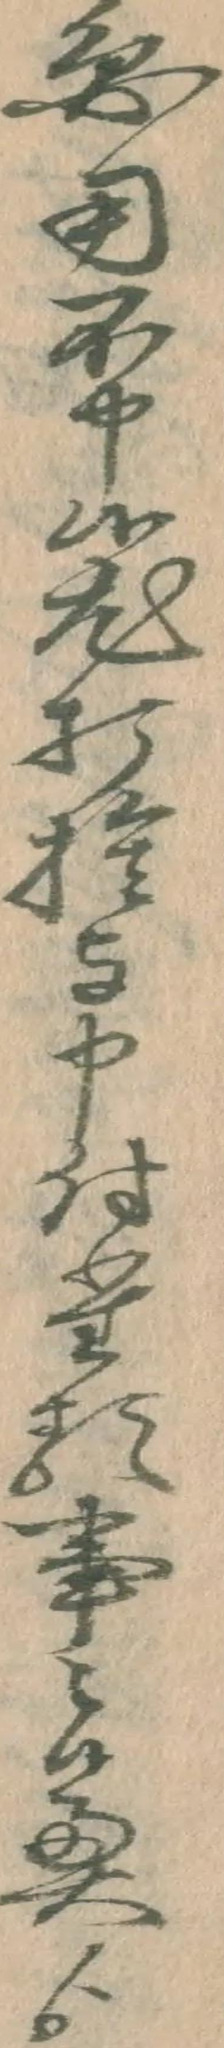円用不申候尤打捨与申付堂類事に候奥ゟ
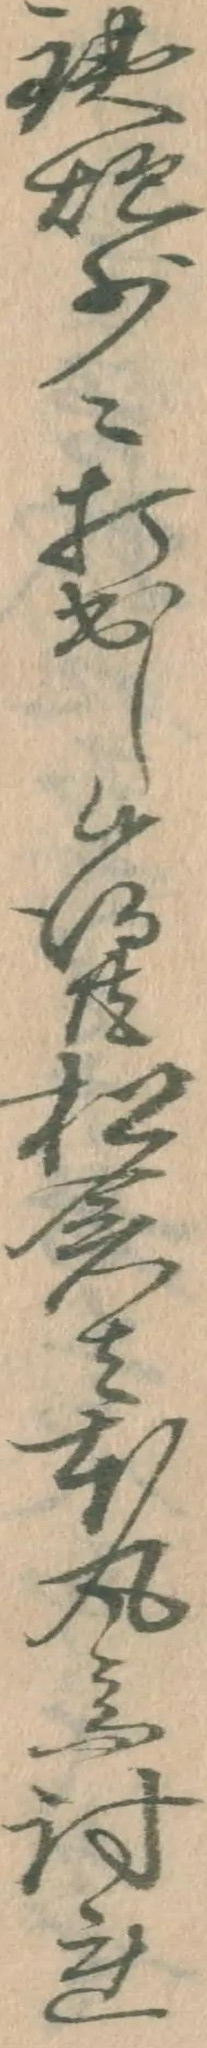鉄砲少々打出し候得共松倉者本丸に而討連

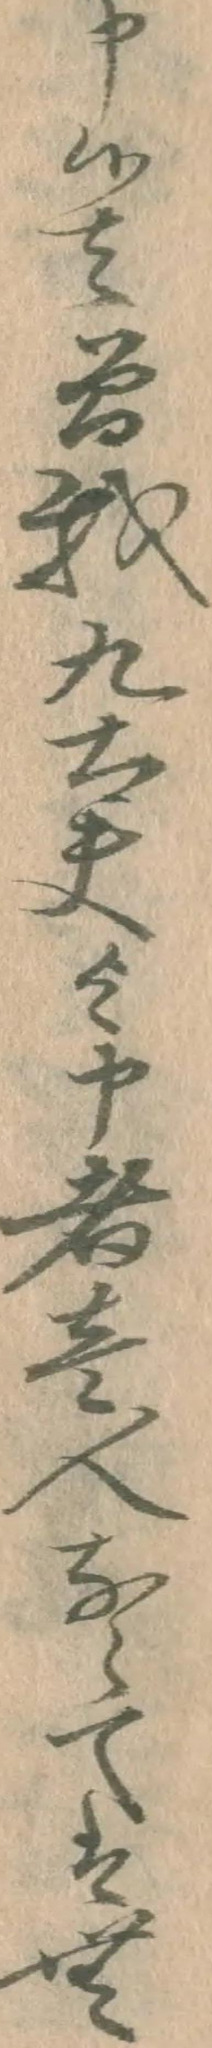申候者曽我九太夫与申者壱人ならて盤無
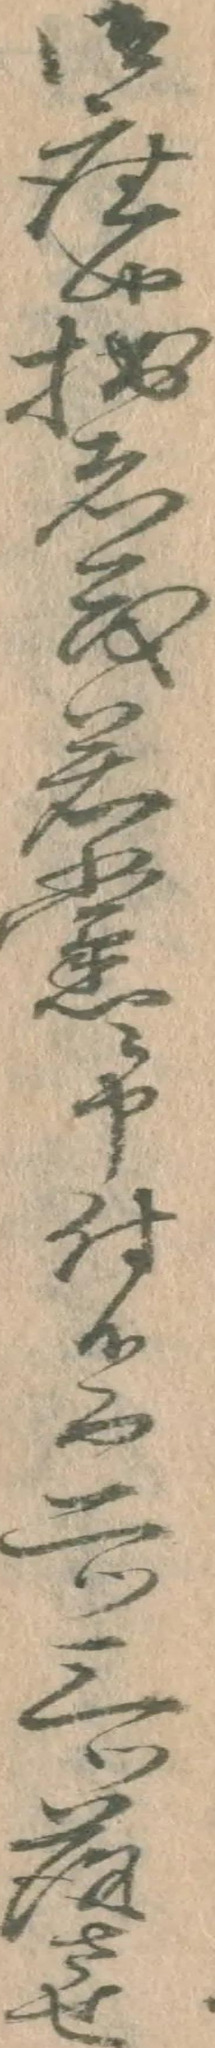御座候拙者茂若党に申付候而二つ三つ落させ
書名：切支丹御退治記 49巻. [8]
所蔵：国立国会図書館 National Diet Library, JAPAN
